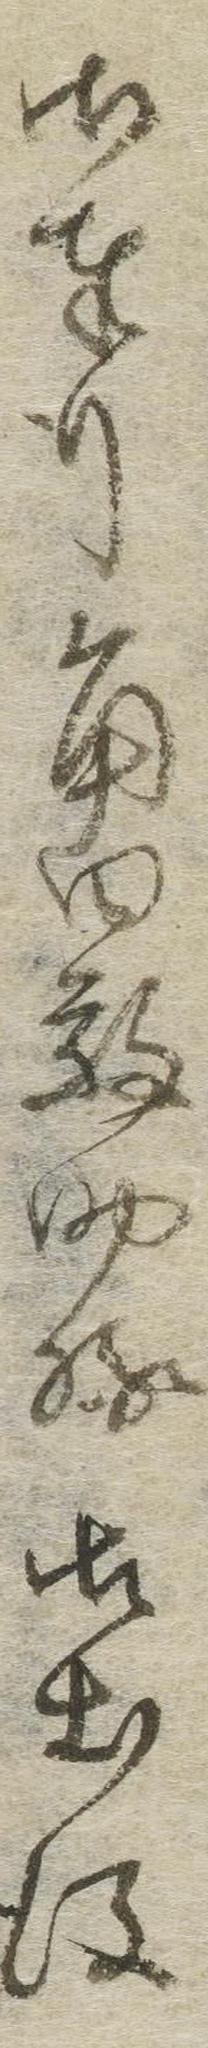御奉行角田駒助様御出役
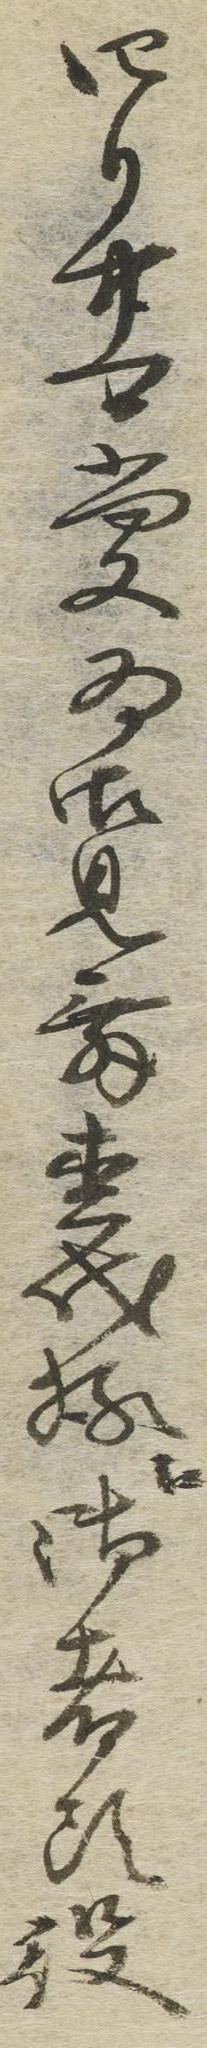四月廿一日尚又御見舞松代様江御者頭役

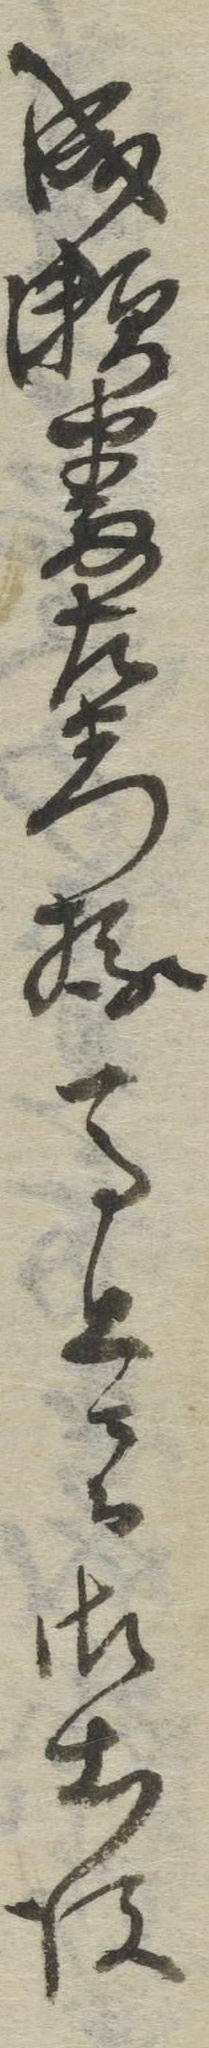成瀬番左衛門様馬上二而御出役
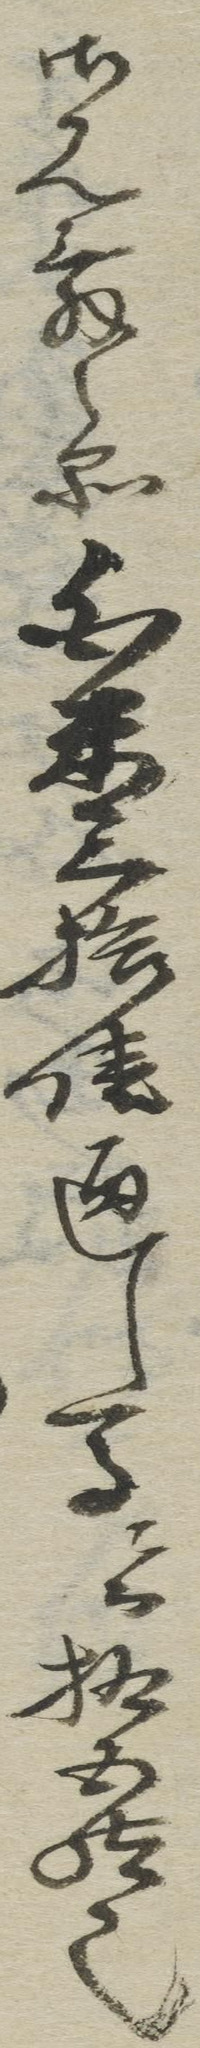御見舞之品白米三拾俵通し馬二而拾五駄之
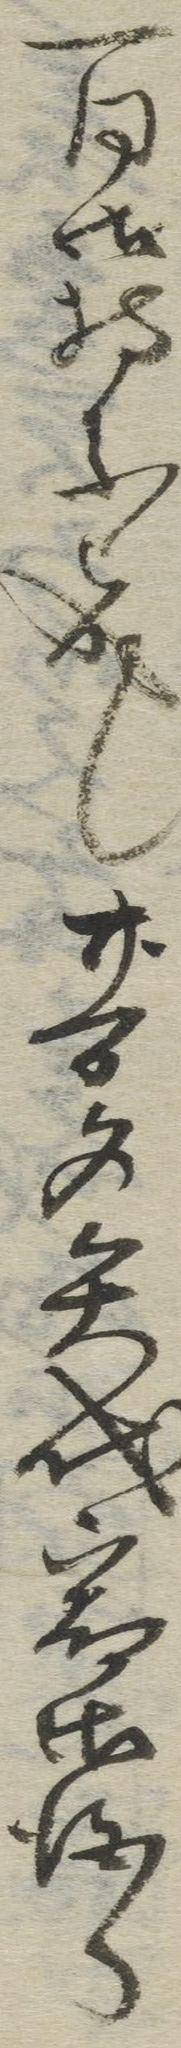一同御持不被成候廿一日夕矢代宿御泊り
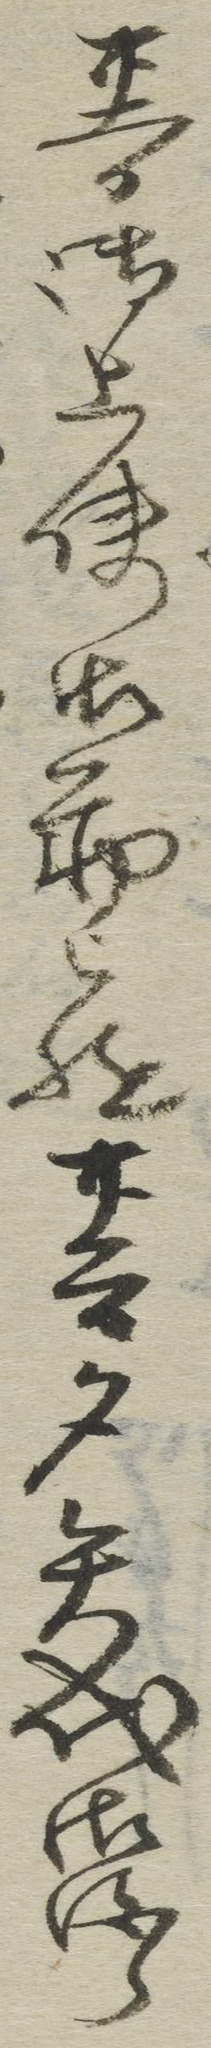廿二日御上史御勤被遊廿二日夕矢代御泊り
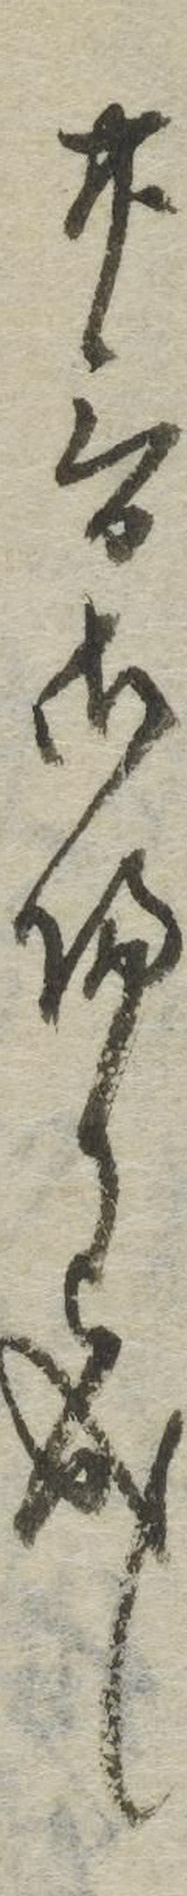廿三日御帰り被成候
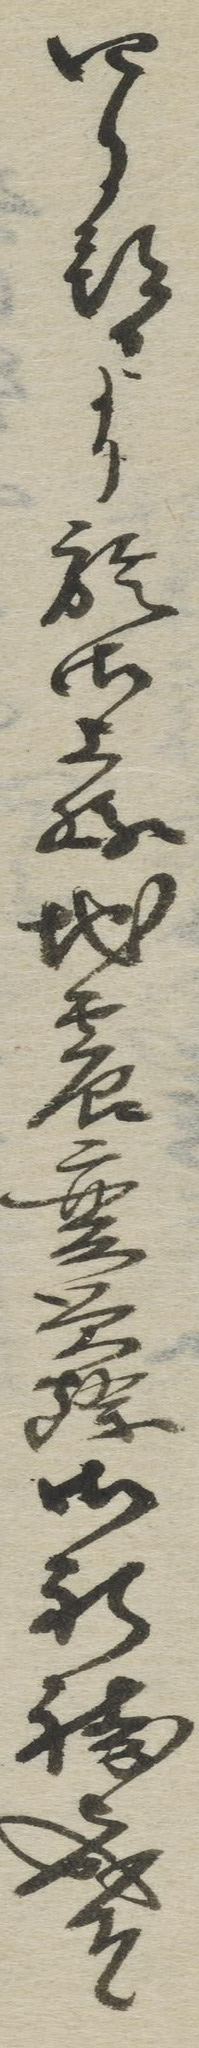四月朔日ゟ於御上様地震変災除御祈祷被成候
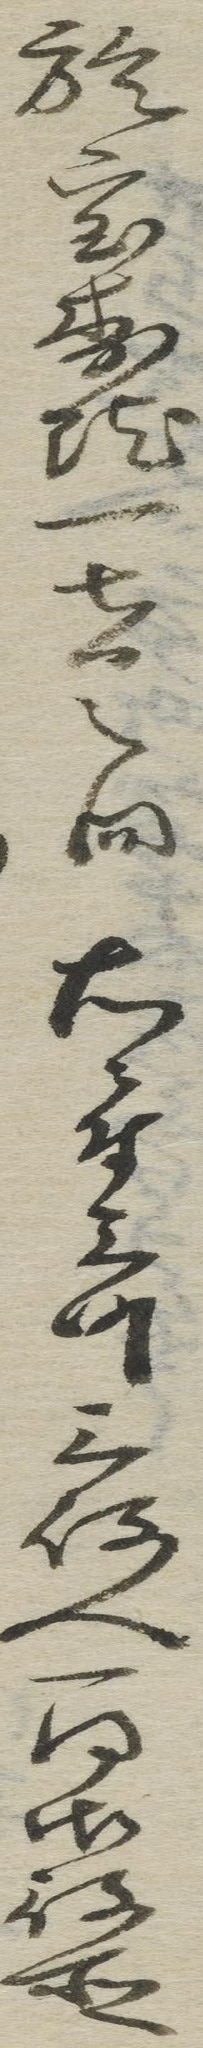於宝寿院一七日之間右二付三町三役人一同御役所へ
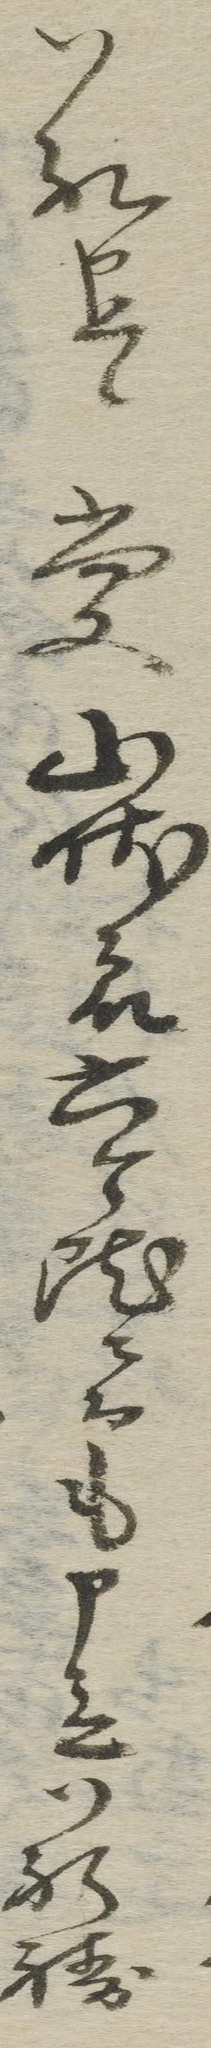御礼申上候尚又山伏衆六ヶ院二而も申立御祈祷
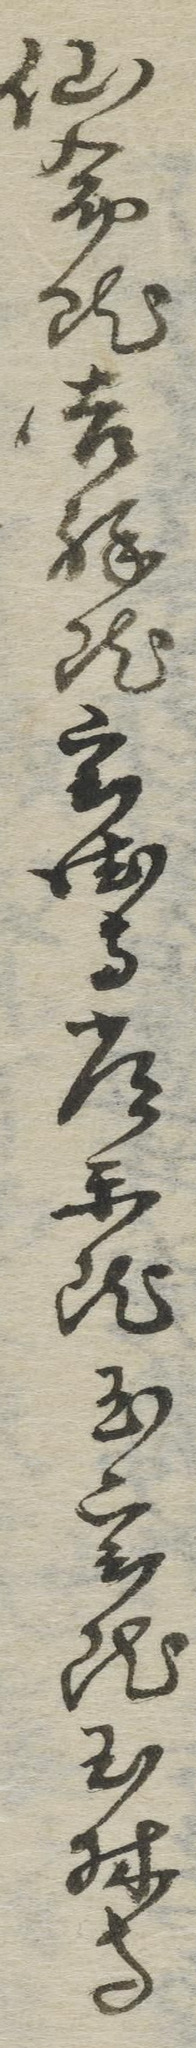仙翁院吉勝院宝徳寺常示院玉宝院玉休寺
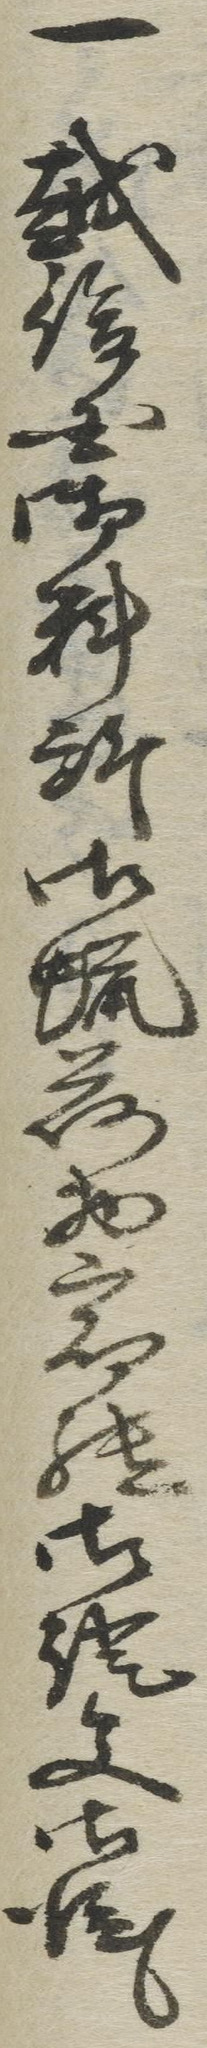越後国御料所御蝋荷物宿継御證文御継も
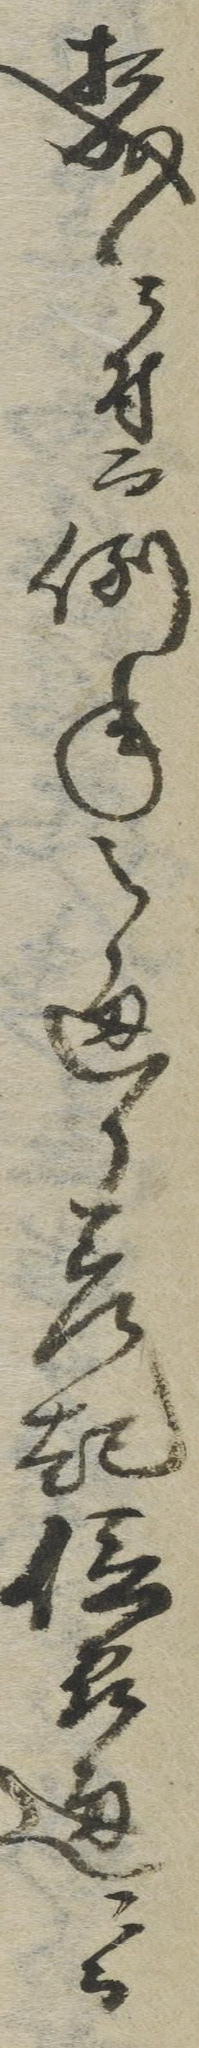相成候二付而例年之通り差配信州通二而
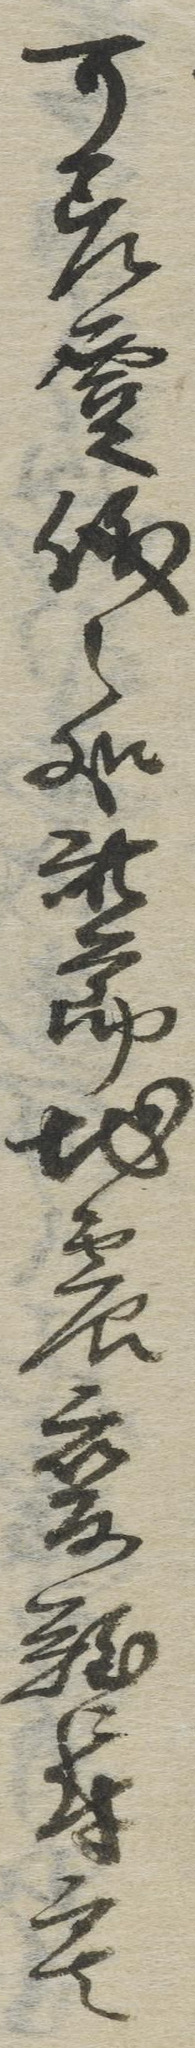可差立儀之処此節地震変難二付而は
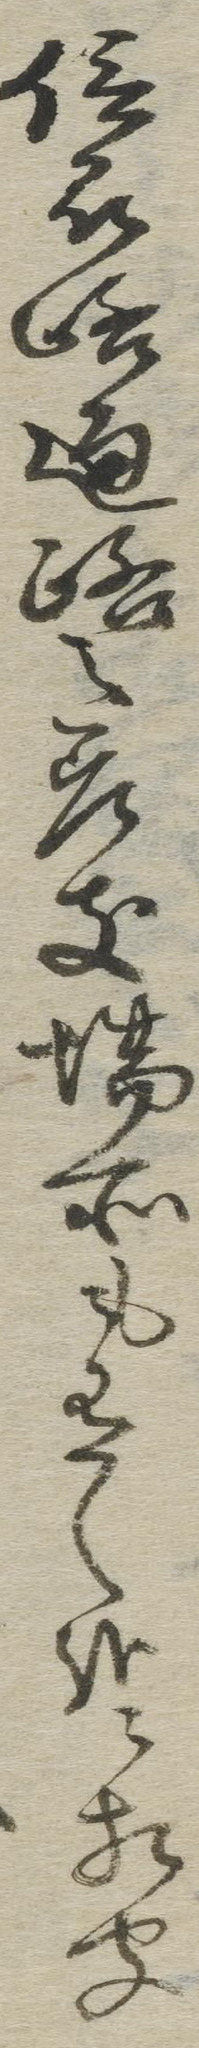信州路通路之差支場所も有之哉二相聞
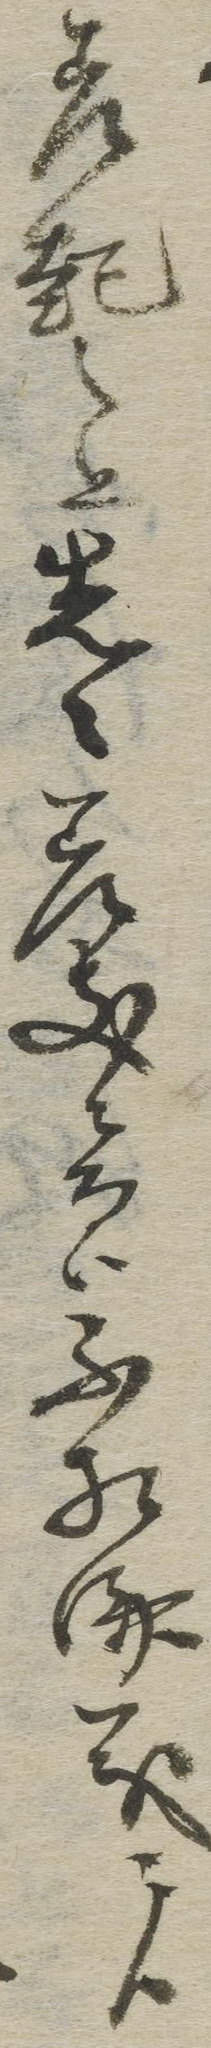差配之上先々差支二而ハ不相済哉二候
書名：信濃越後　地震書留
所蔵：東京大学地震研究所図書室 Earthquake Research Institute Library, The University of Tokyo, JAPAN
